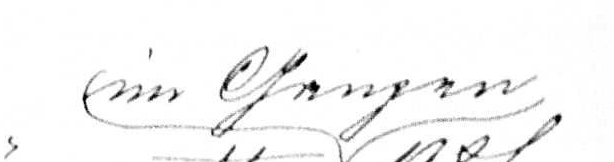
im Ganzen
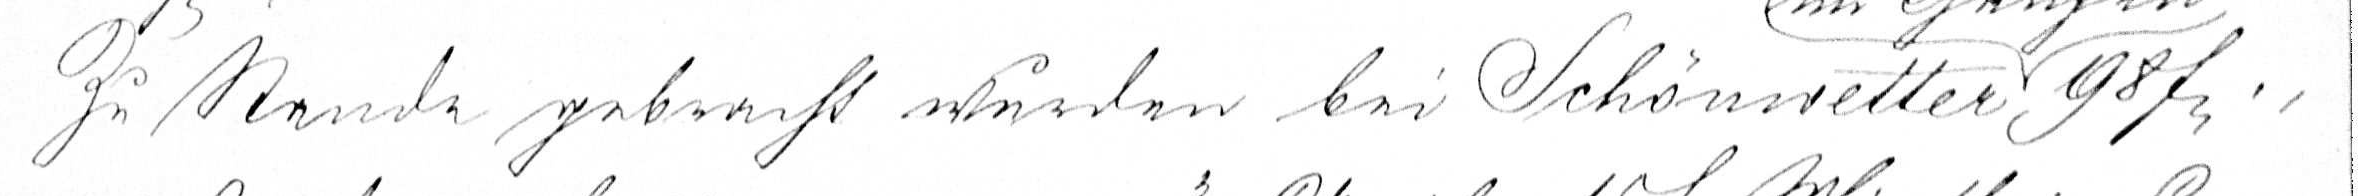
Zu Stunde gebracht wurden bei Schönwetter 98f
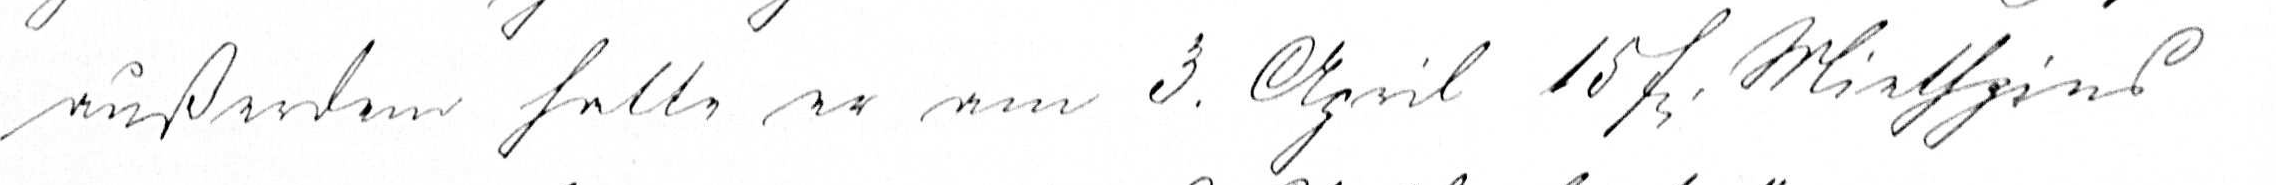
außerdem hatte er am 3 April 15 f. Wirthzins
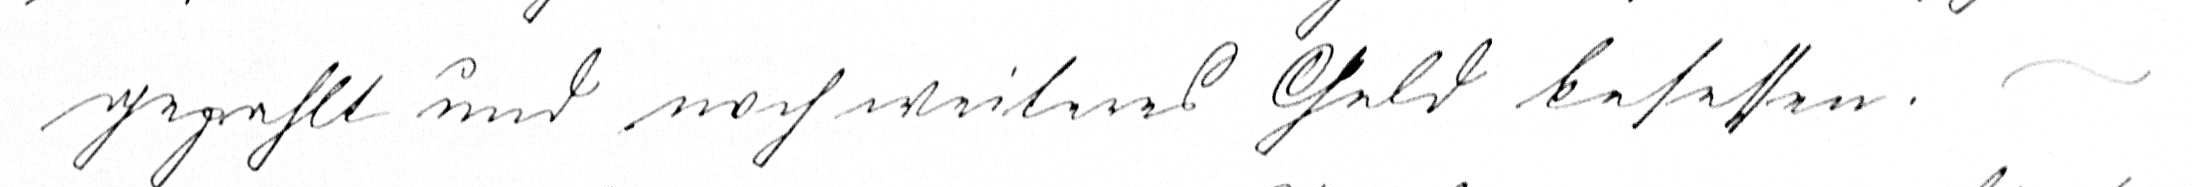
gezahlt und noch weiteres Geld besessen.
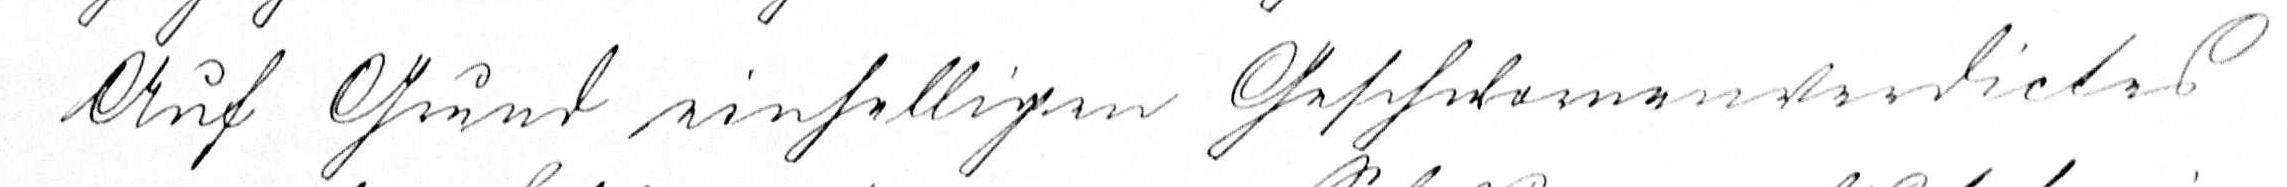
Auf Grund einhelligen Geschworenenverdictes
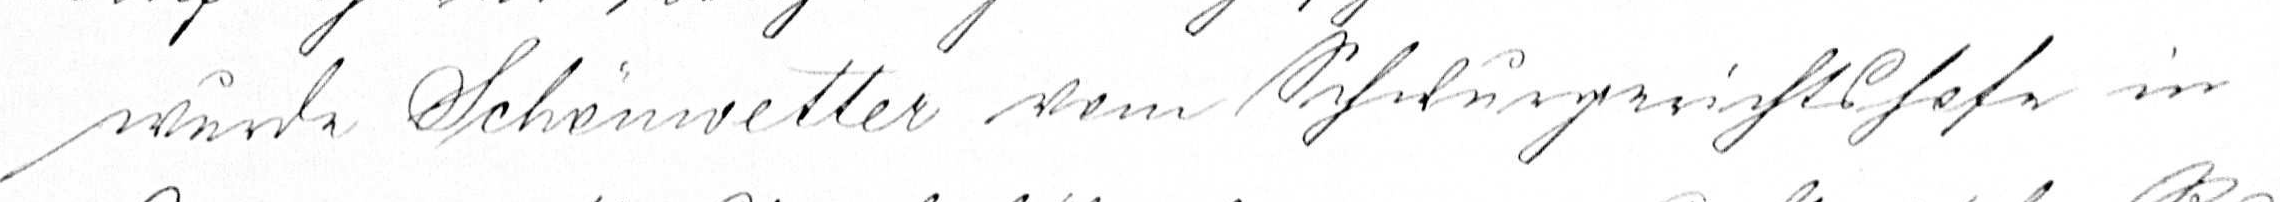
wurde Schönwetter vom Schwurgerichtshofe in
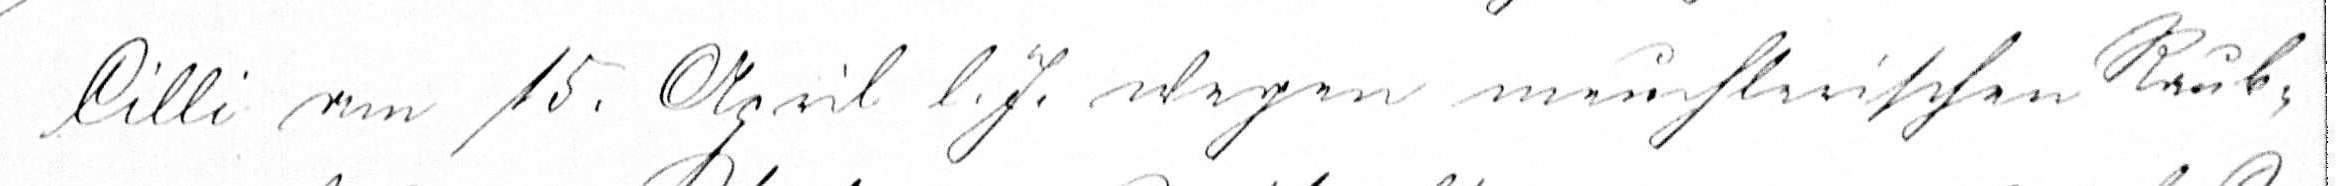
Cilli am 15. April l. J. wegen meuchlerischen Raub¬
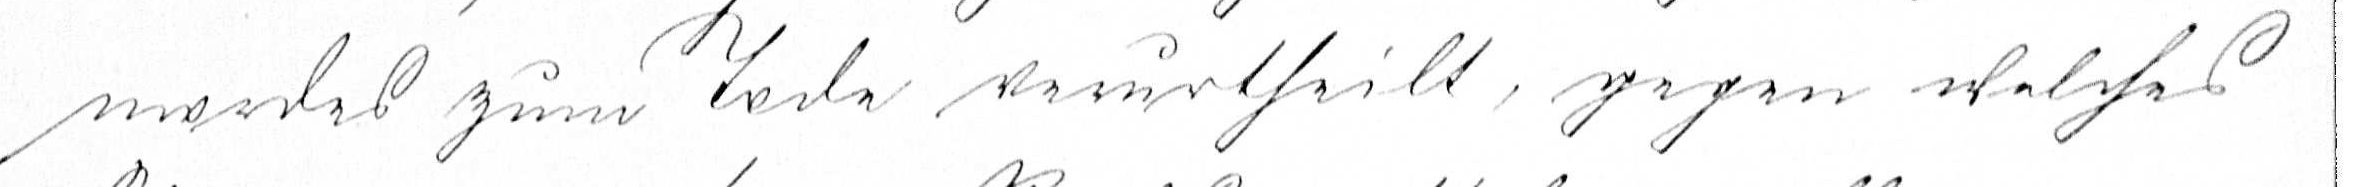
mordes zum Tode verurtheilt, gegen welches
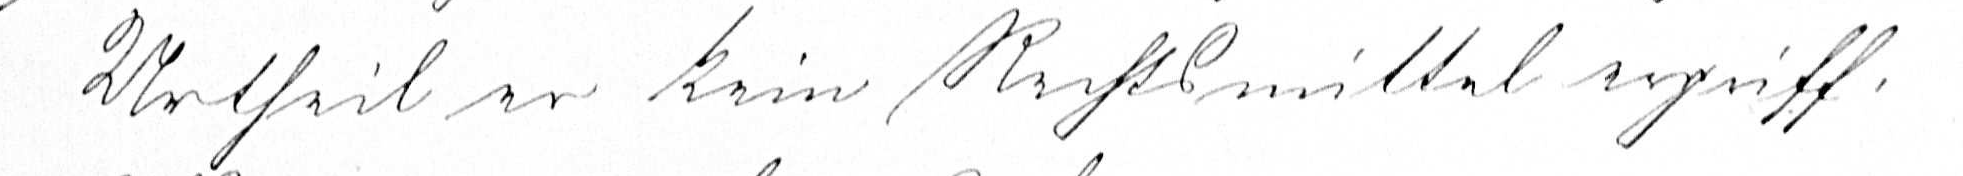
Urtheil er kein Rechtsmittel ergriff.
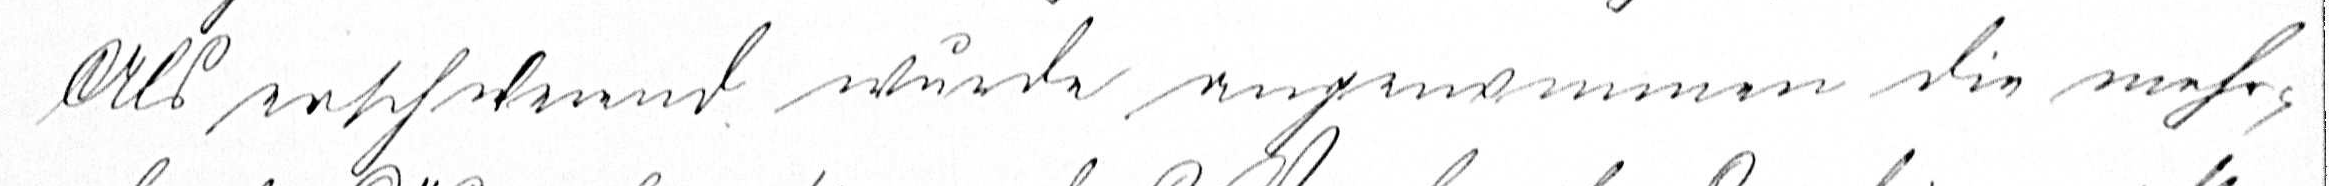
Als erschwerend wurde angenommen die mehr¬
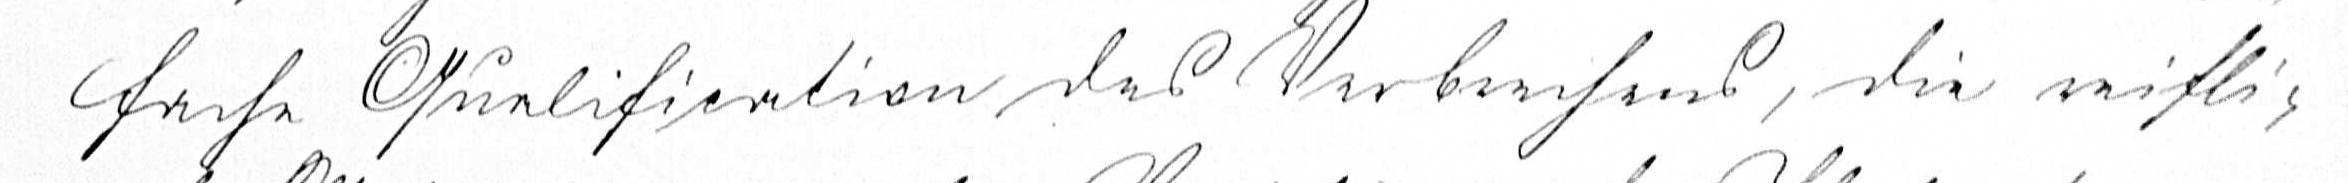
fache Qualification des Verbrechens, die reifli¬
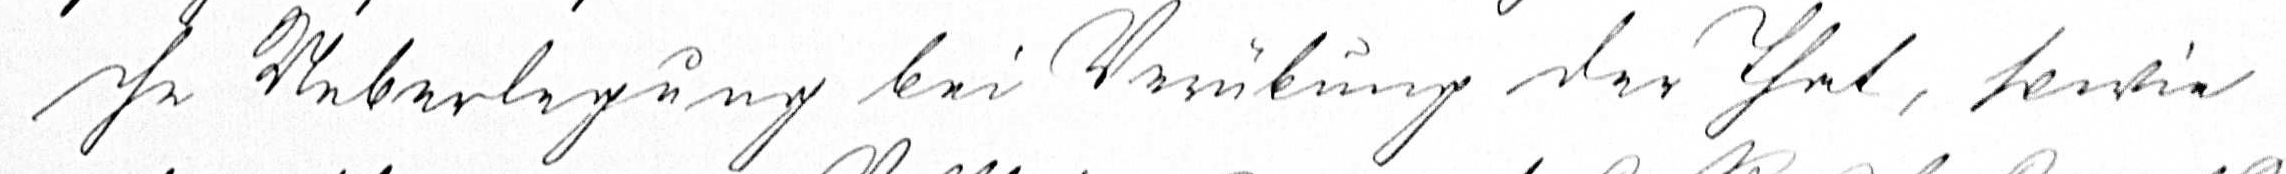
che Ueberlegung bei Verübung der That, sowie
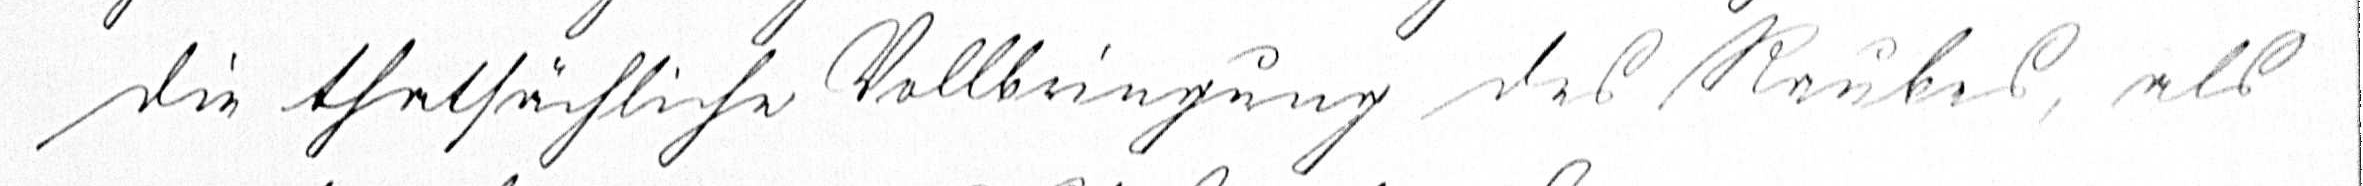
die thatsächliche Vollbringung des Raubes, als
